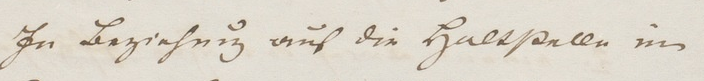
In Beziehung auf die Haltstelle in
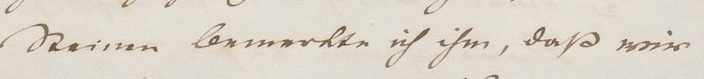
Steinen bemerkte ich ihm, daß wir
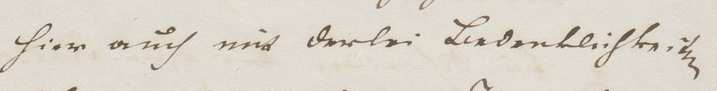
hier auch mit derlei Bedenklichkeiten
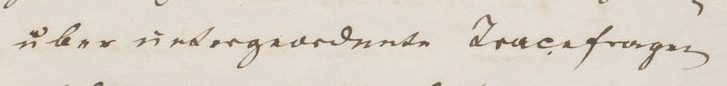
über untergeordnete Tracefragen
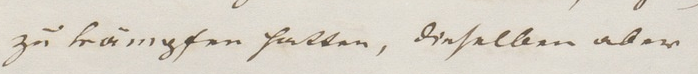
zu kämpfen hatten, dieselben aber
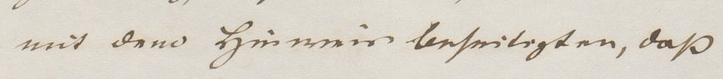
mit dem Hinweis beseitigten, daß
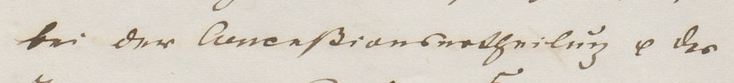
bei der Conceßionsertheilung & der
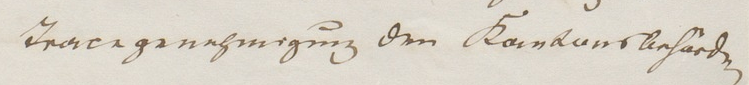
Tracegenehmigung den Kantonsbehörden
